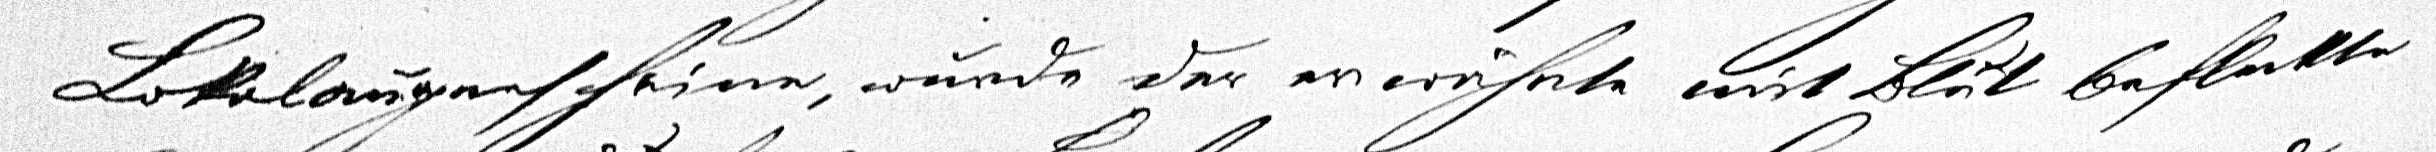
Lokalaugescheine, wurde der er wähnte mit Blut bestellte
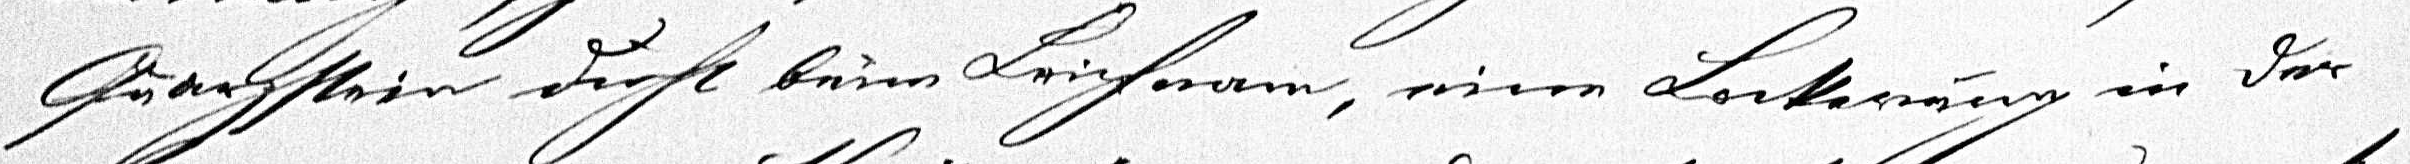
Quarzstein dicht beim Leichnam, eine Lockerung in der
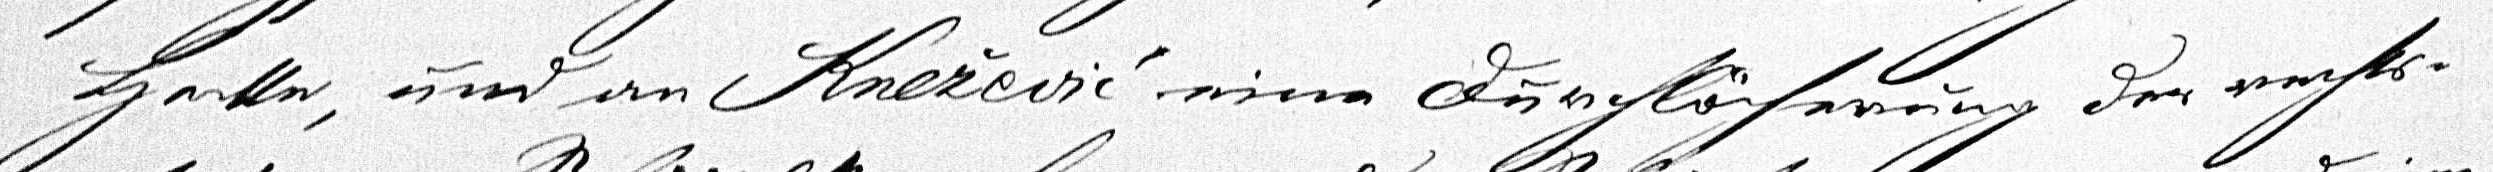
Hatte, und an Knežević eine Durchlöcherung der rechts¬
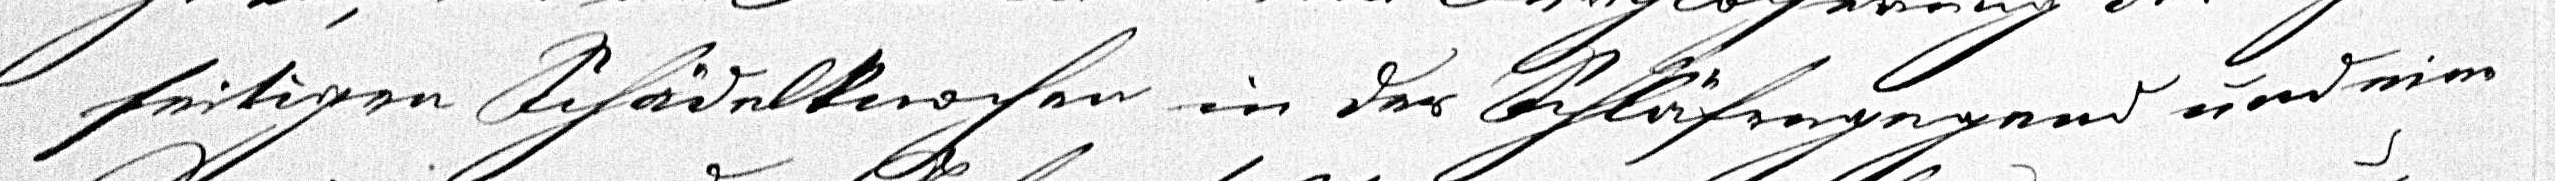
seitigen Schädelknochen in der Schläfengegend und eine
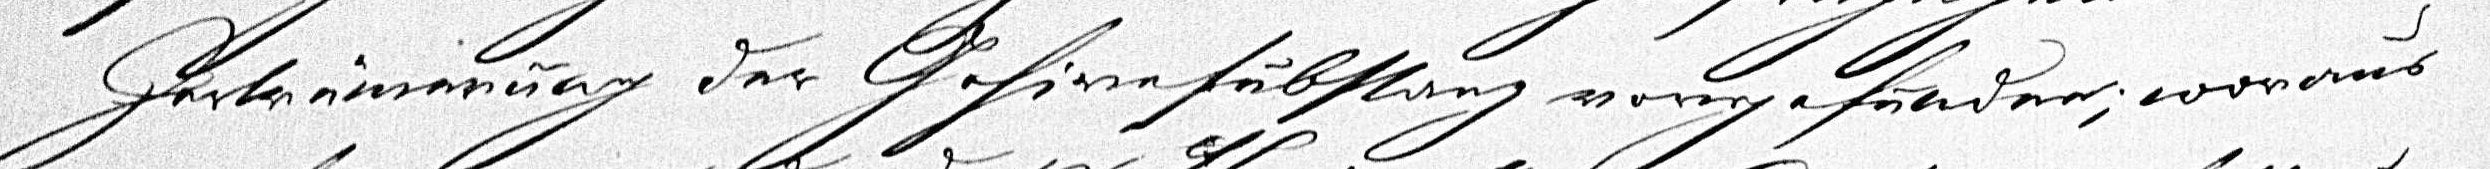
Zertrümerung der Gehirnsubstanz vorgefunden; woraus
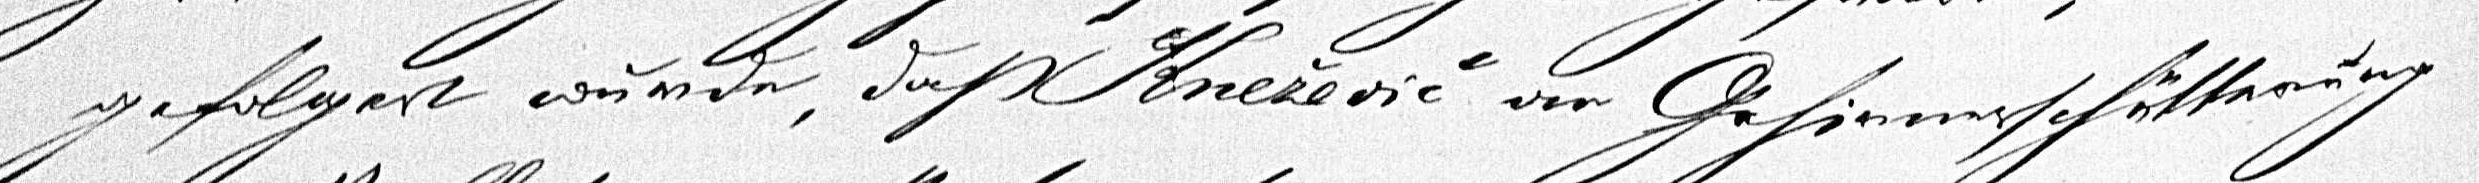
gefolgert wurde, daß Knežević an Gehirnerschütterung
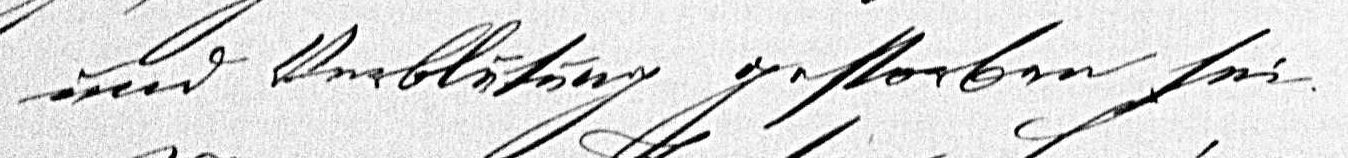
und Verblutung gestorben sei.
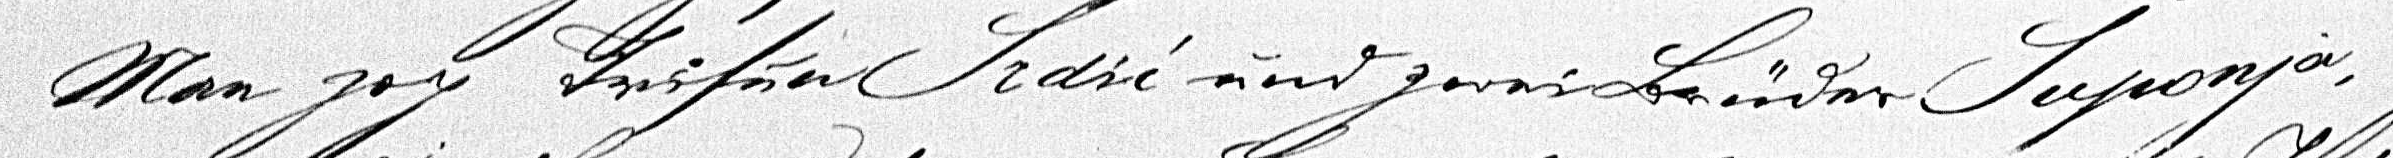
Man zog xx Srdić und zwei Brüder Suponja,
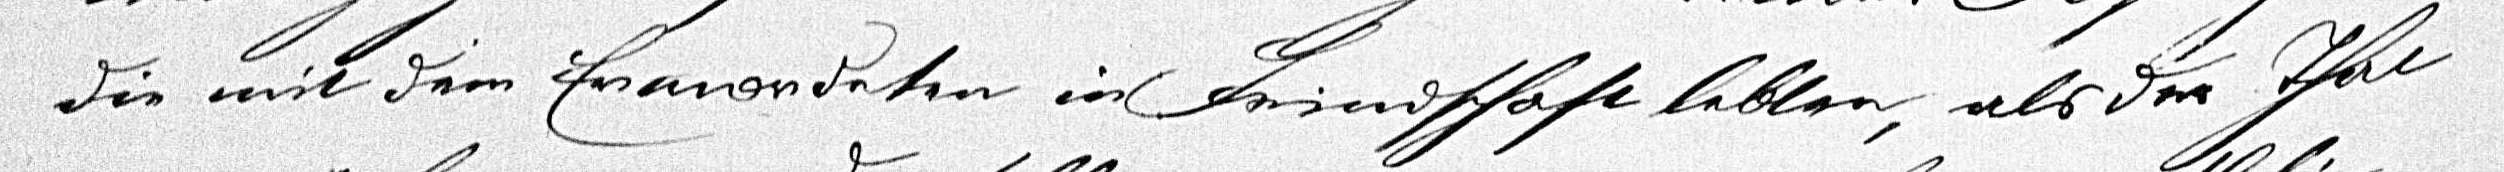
die mit dem Ermordeten in Friedschaft lebten, als der That
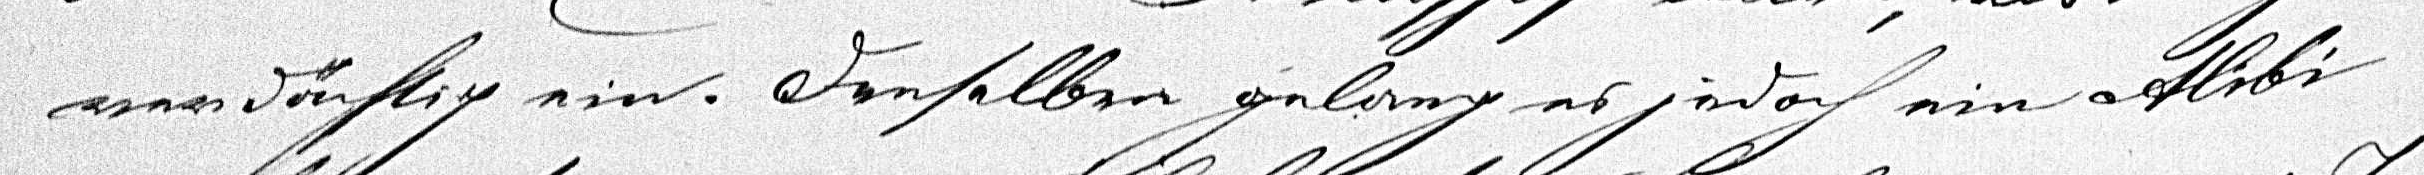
verdächtig ein. Denselben gelang es jedoch ein Alibi
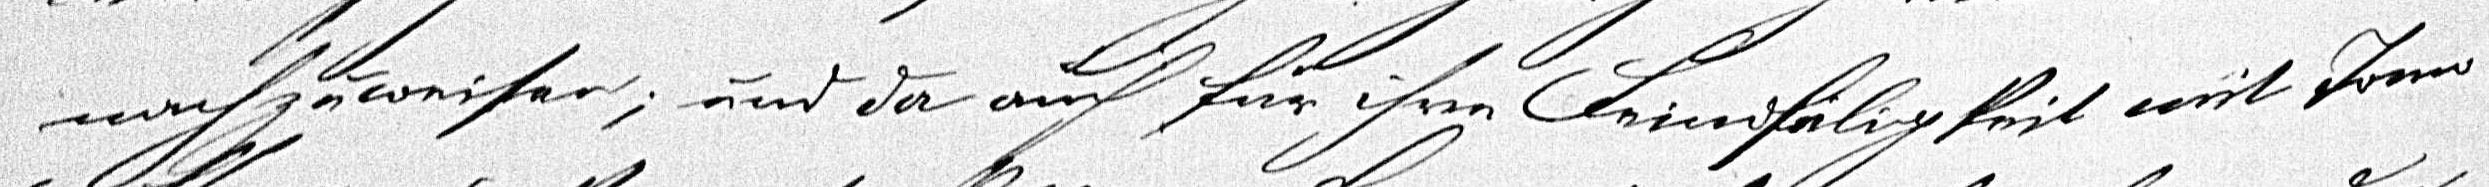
nach zuweisen; und da auch für ihre xxfäligkeit mit xx
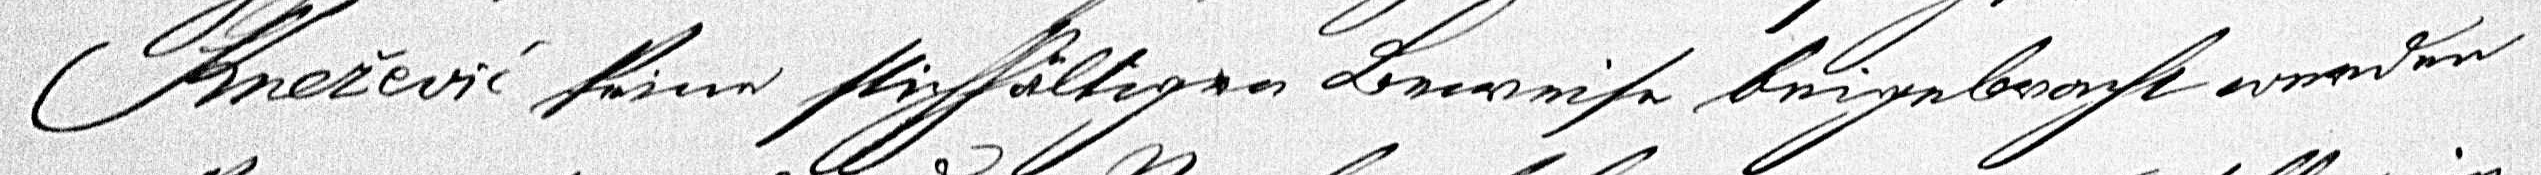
Knežević keine stichhältigen Beweise beigebracht werden
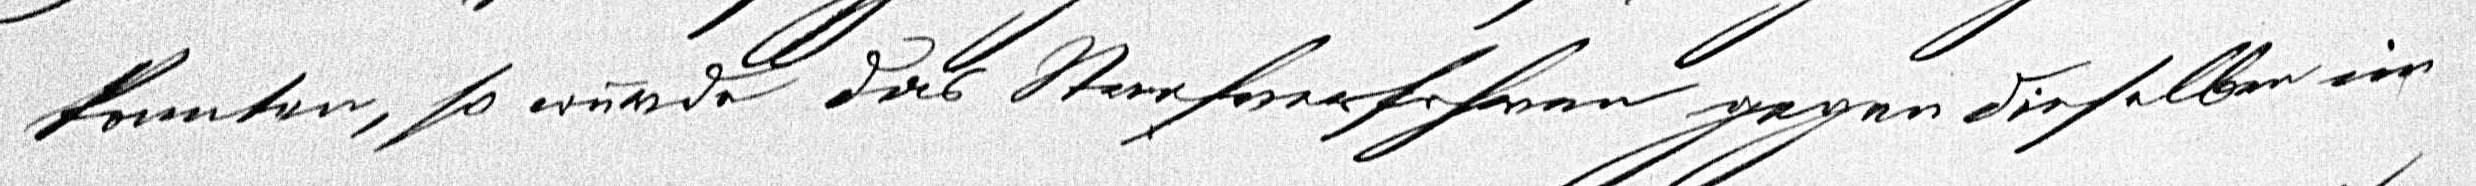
konnten, so wurde das Strafverfahren gegen dieselben im
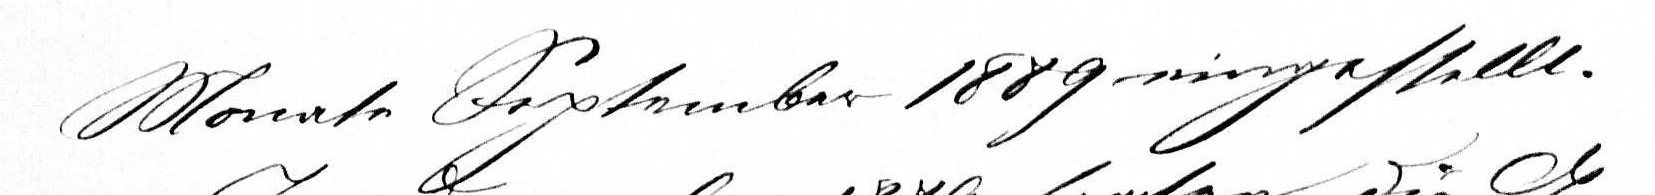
Monate September 1889 eingestellt.
